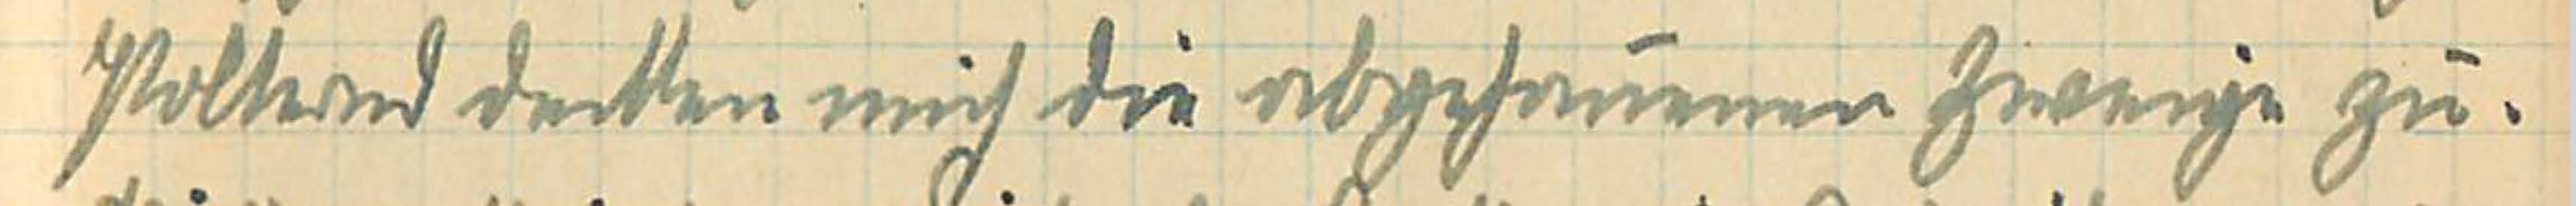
Polternd deckten mich die abgehauenen Zweige zu.
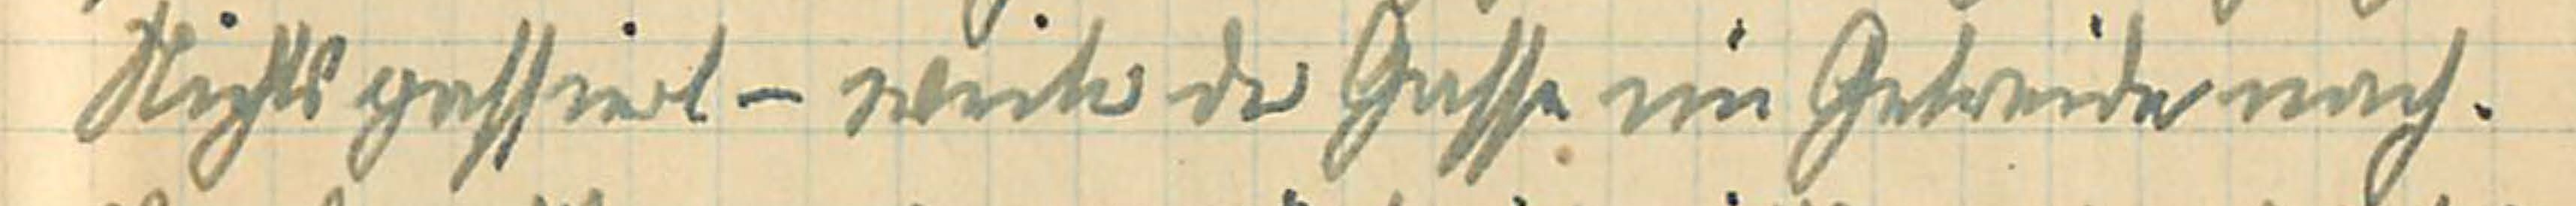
Nichts passiert – weiter der Gasse im Getreide nach.
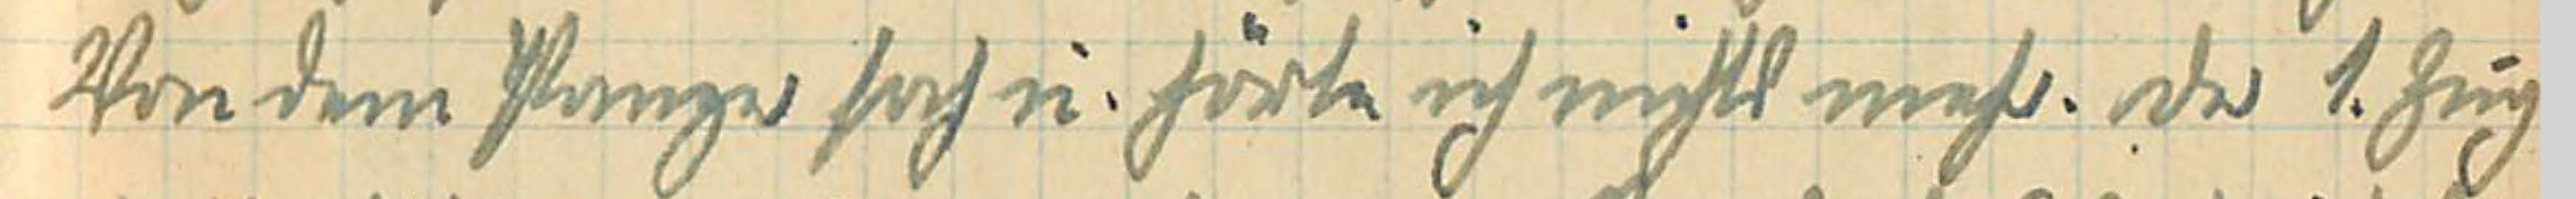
Von dem Panzer sah u. hörte ich nichts mehr. Der 1. Zug
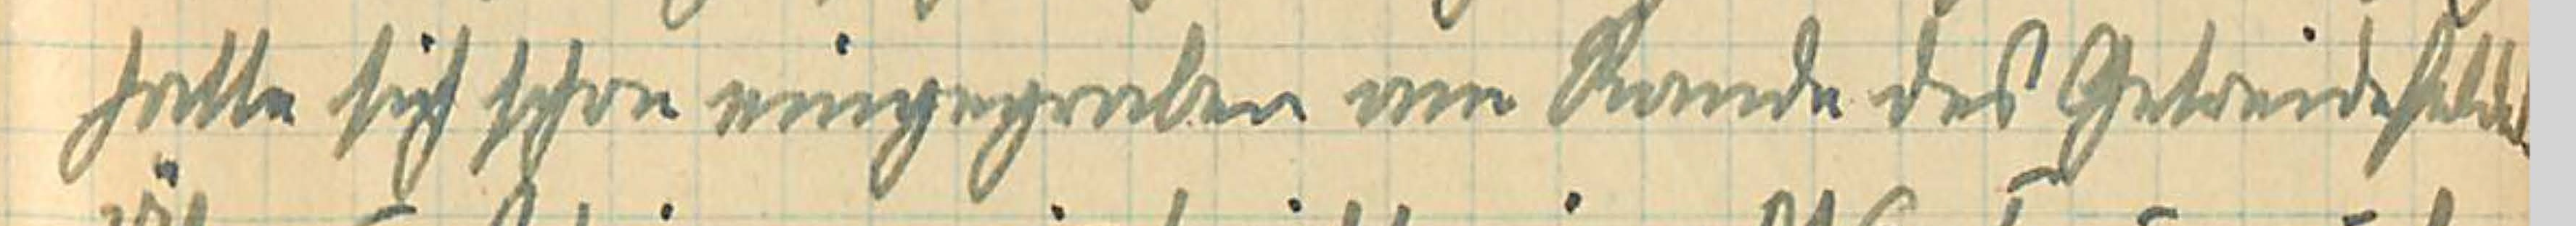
hatte sich schon eingegraben am Rande des Getreidefeldes.
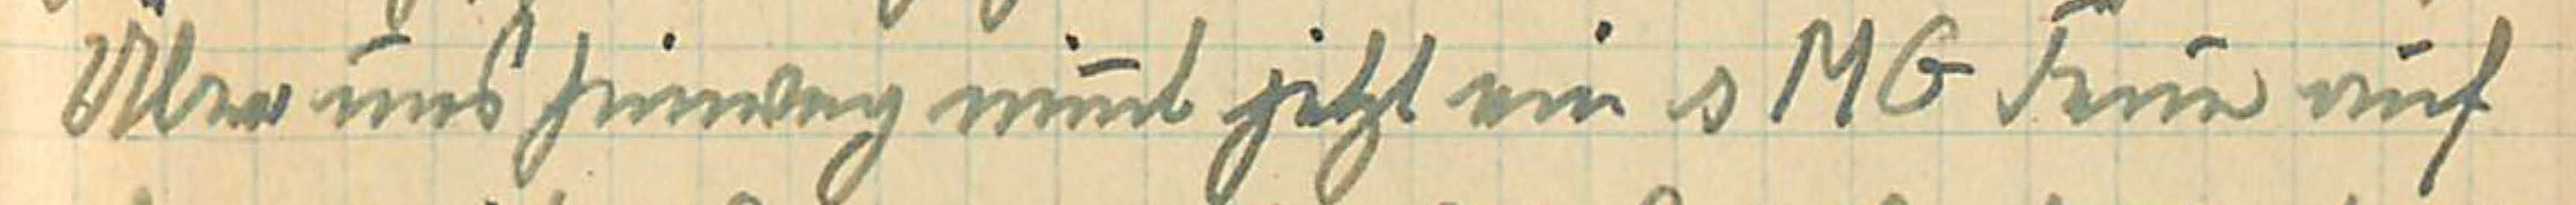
Über uns hinweg nimmt jetzt ein s MG Feuer auf
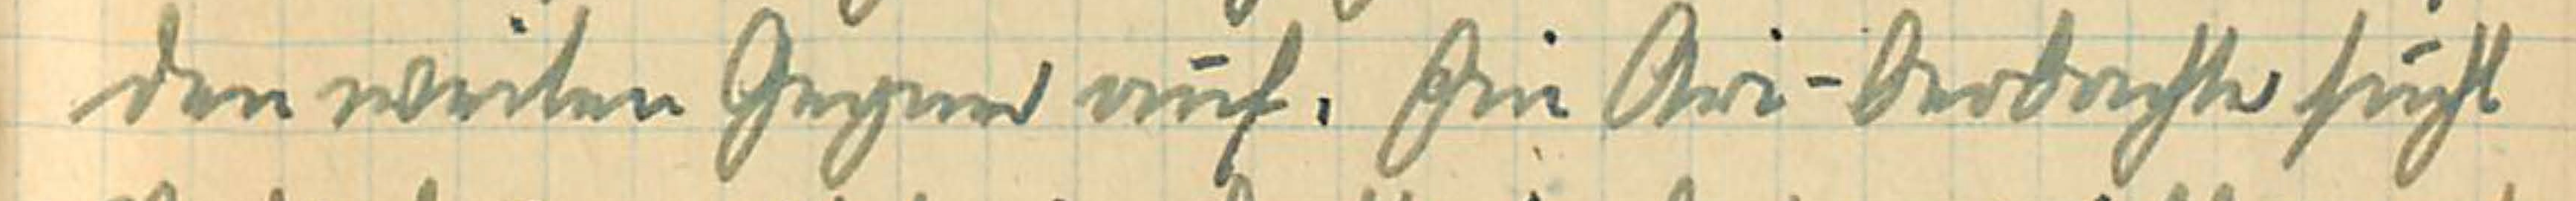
den weiten Gegner auf. Ein Ari-Beobachter sucht
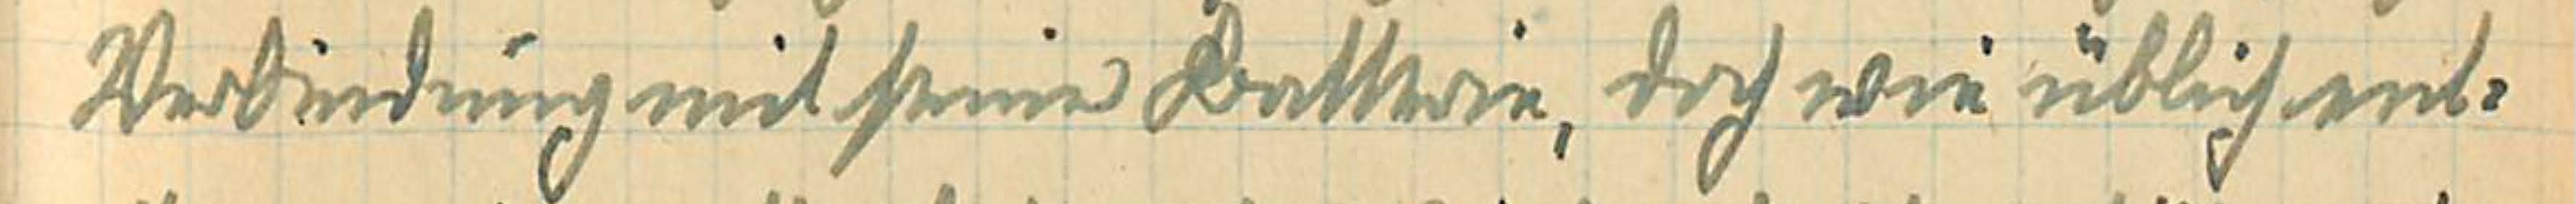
Verbindung mit seiner Batterie, doch wie üblich ent-
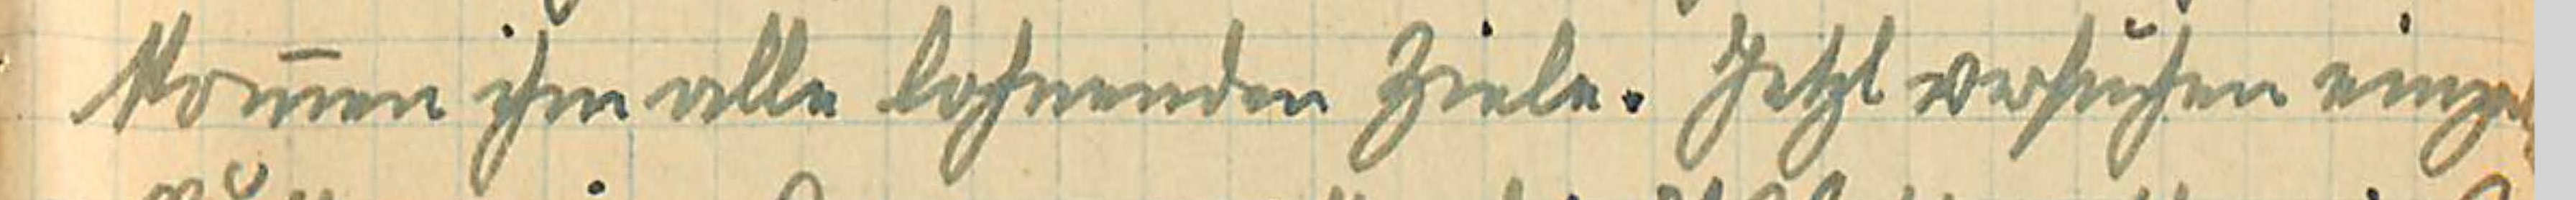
kommen ihm alle lohnenden Ziele. Jetzt versuchen einzelne
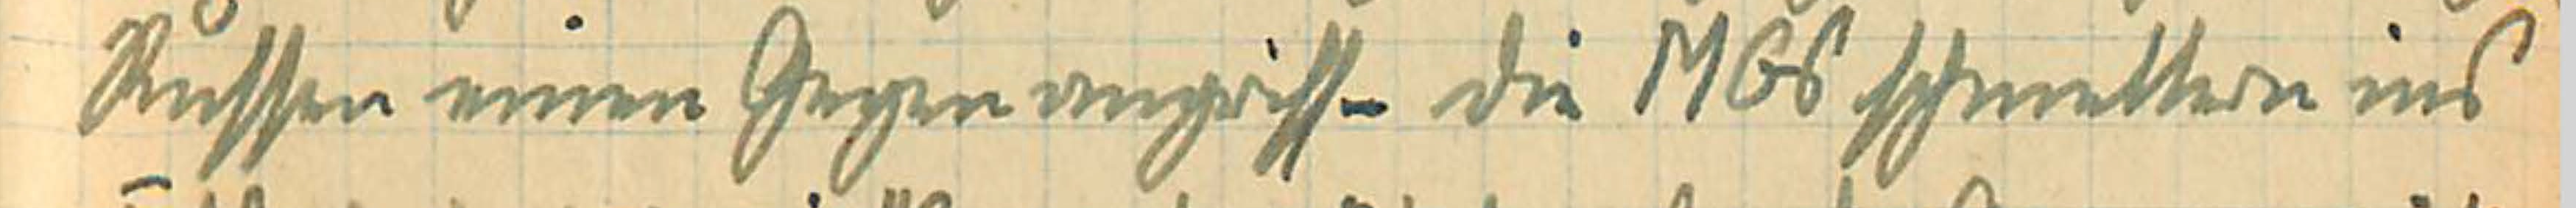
Russen einen Gegenangriff – Die MGs schmettern ins
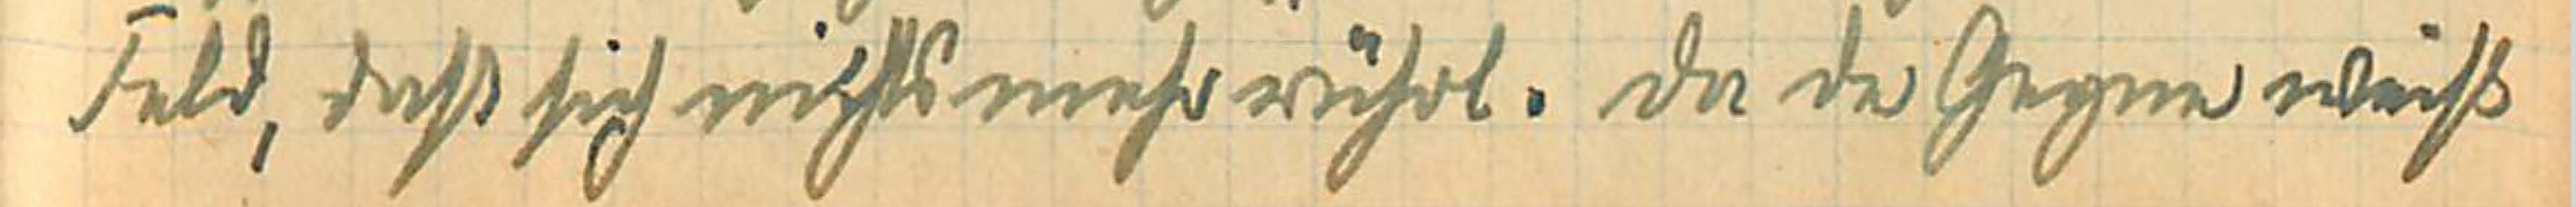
Feld, daß sich nichts mehr rührt. Da der Gegner weiß
